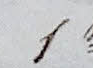1
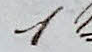1
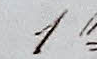1
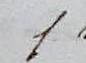1
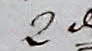2
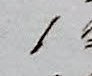1
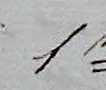1
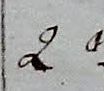2
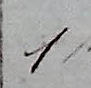1
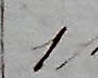1
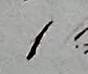1
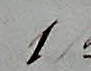1
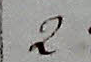2
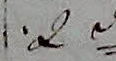2
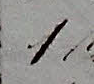1
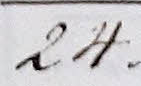24
